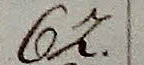62.
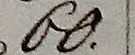60.
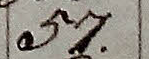57.
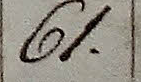61.
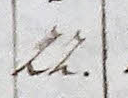22.
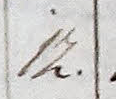12.
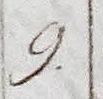9.
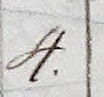4.
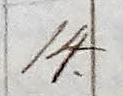12.
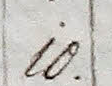10.
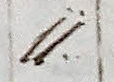11.
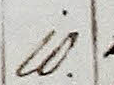10.
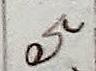5
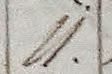11.
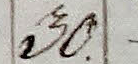30.
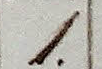1.
